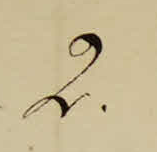2.
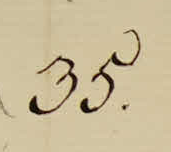35.
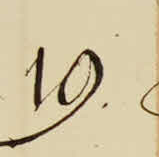19.
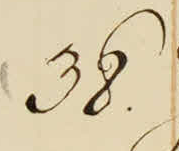38.
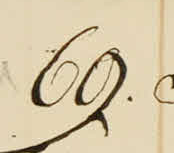69.
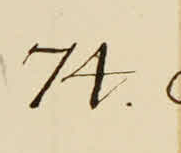74.
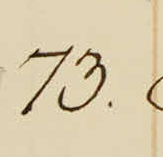73.
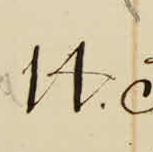14.
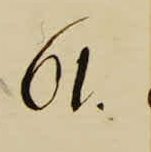61.
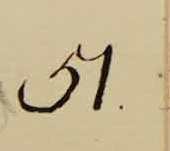51.
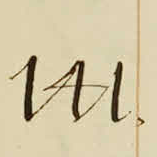141
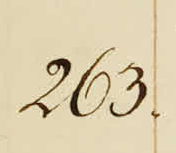263
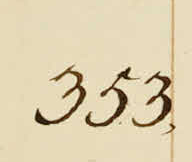353,
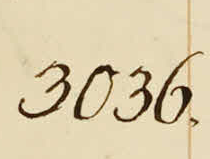3036
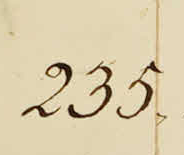235
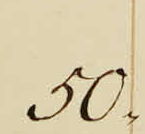50
